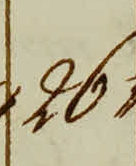26
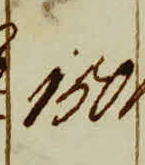150
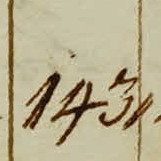143
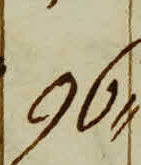96
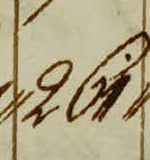261
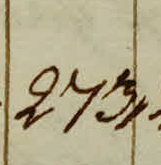273
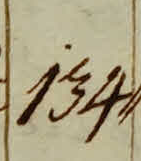134
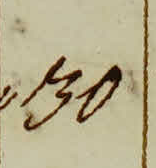30
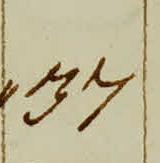37
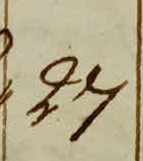27
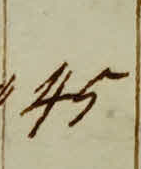45
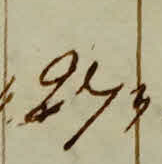27
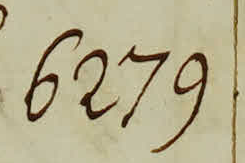6279
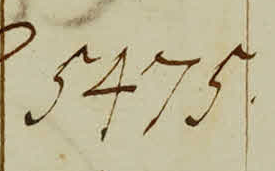5475
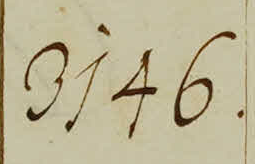3146
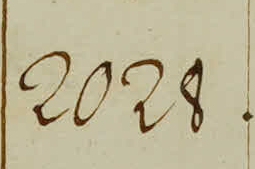2028
